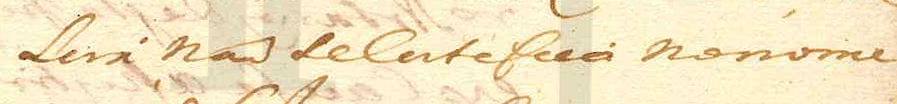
Lirá naõ se Certefica no nome
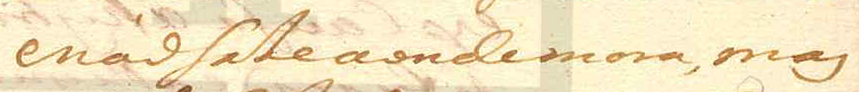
e naõ sabe aonde mora, mas
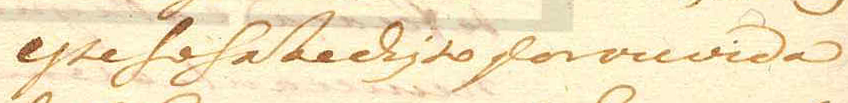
este so sabe disto por ouvida
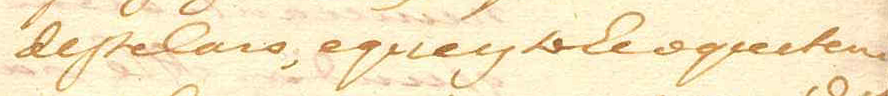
deste cazo, e que isto he o que tem
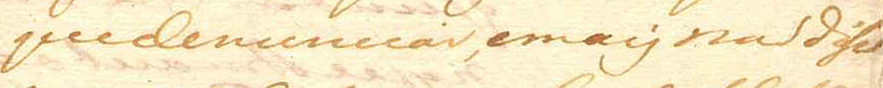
que denunciar, e mais naõ disse
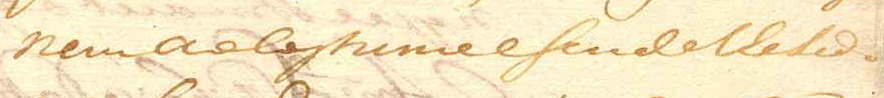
nem ao costume e sendolhe lido
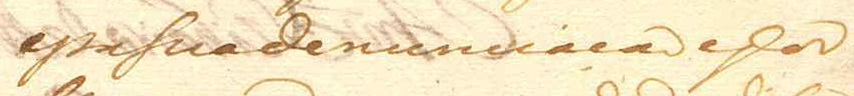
esta sua denunciaçaõ e por
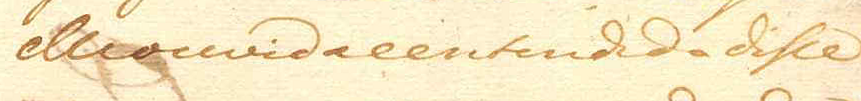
elle ouvida, e entendida disse
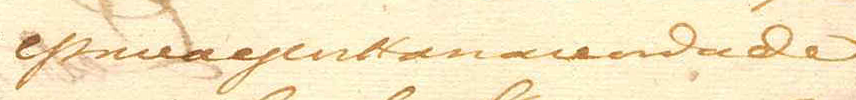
estaua escritta na uerdade
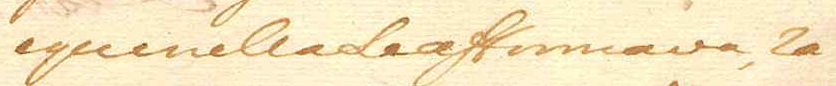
e que nella se affirmava, Ra
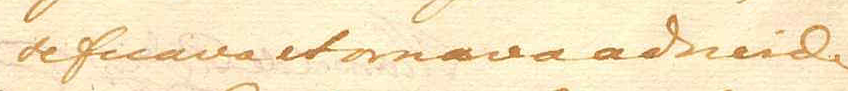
teficava e tornava a dizer de
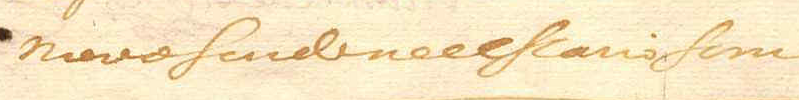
novo sendo necessario sem
